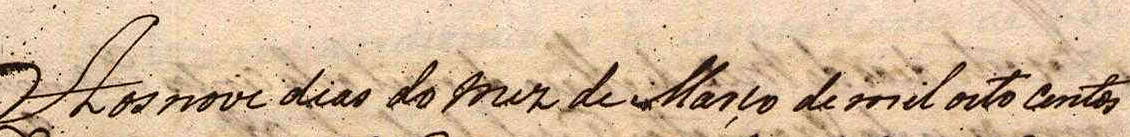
Aos nove dias do mez de Março de mil oitocentos
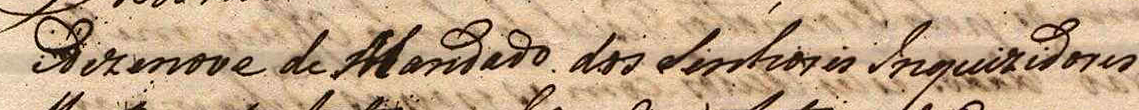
Dezenove de Mandado dos Senhores Inquizidores
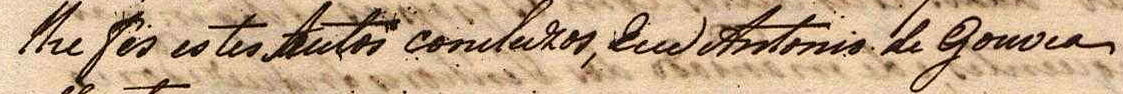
lhe fis estes Autos concluzos, E eu Antonio de Gouvea
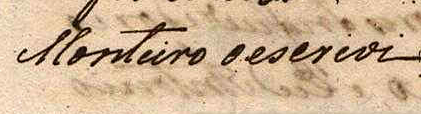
Monteiro o escrivi
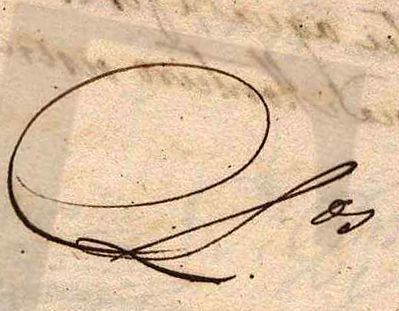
CL.os
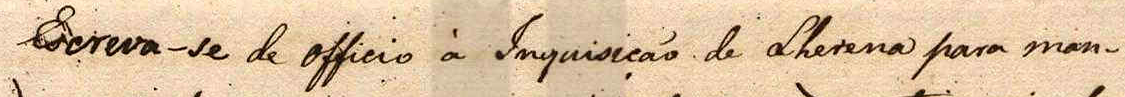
Escreva-se de officio à Inquisiçaõ de Lherena para man
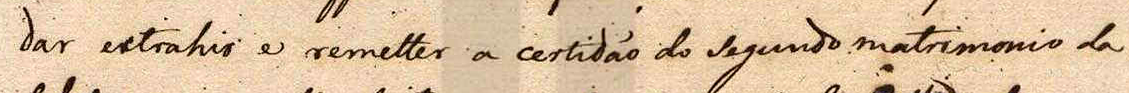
dar extrahir e remetter a certidaõ do segundo matrimonio da
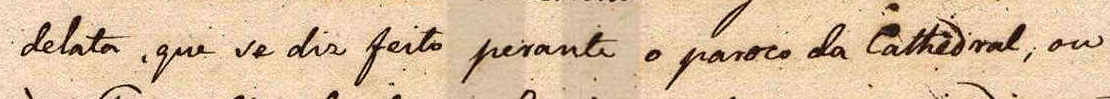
delata, que se diz feito perante o paroco da Cathedral, ou
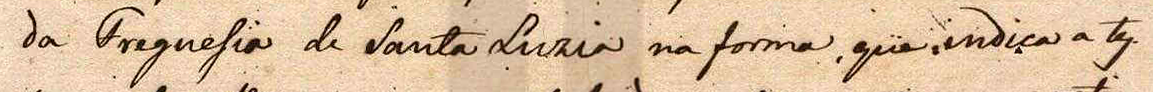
da Freguesia de Santa Luzia na forma, que indica a tes
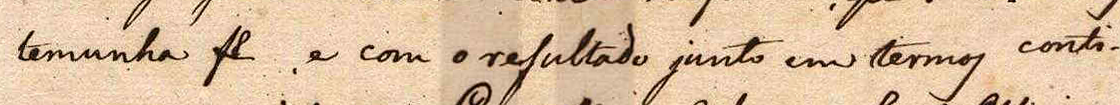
temunha fl, e com o resultado junto em termos conti
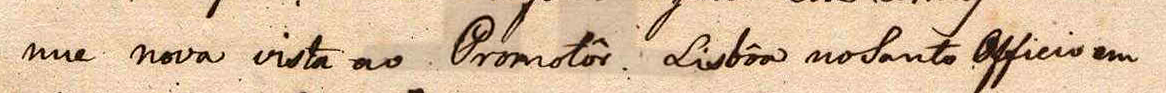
nue nova vista ao Promotôr. Lisboa no Santo Officio em
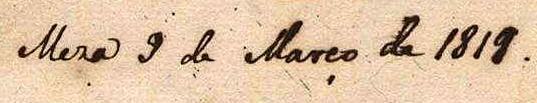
Meza 9 de Março de 1819.
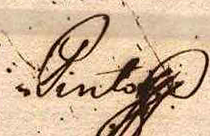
Pinto
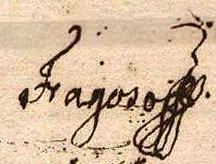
Fragoso
